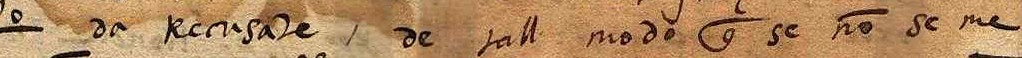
fo da Recusāte / de tall modo q̄ se nō se me
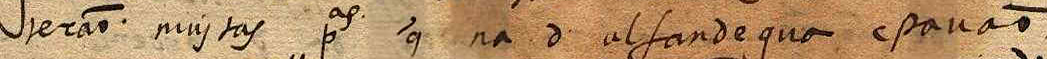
terão mujtas pas. q̄ na d. alfandegua estauão
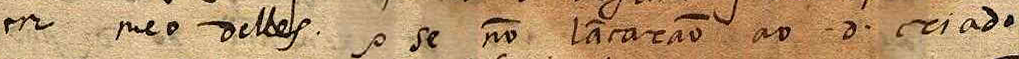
em meo delles. e se n̄o lāçarão ao d. criado
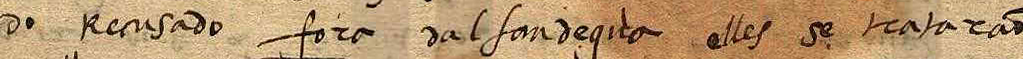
do Recusado fora dalfandegua elles se tratarão
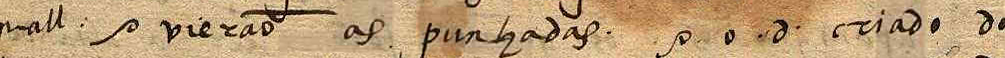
mall. e vierão as punhadas. e o .d. criado do
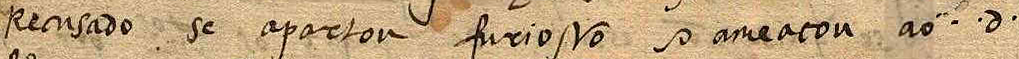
Recusado se apartou furiosso e ameaçou ao d.
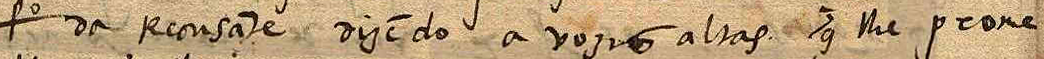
fo da Recusāte dizēdo a vozes altas q̄ lhe prome
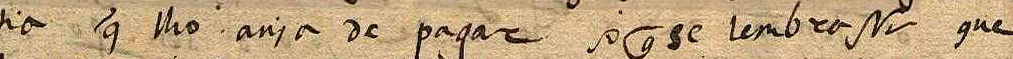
tia q̄ lho auja de pagar e q̄ se lembrasse que
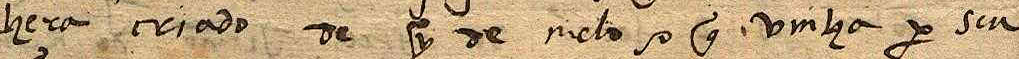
hera criado de yo de melo e q̄ vinha ꝑ seu
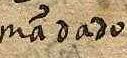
mādado
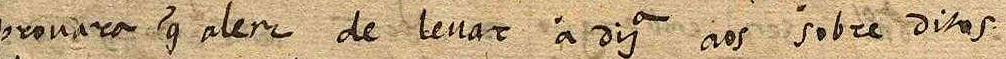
prouara q̄ alem de leuar a diza aos sobreditos.
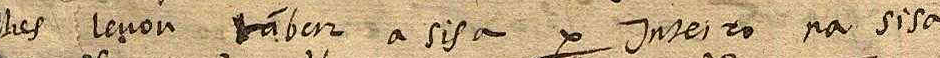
lhes leuou tābem a sisa ꝑ Jnteiro na sisa
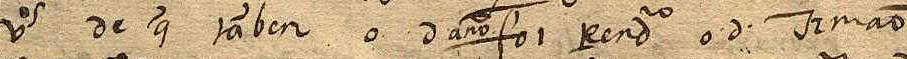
vos de q̄ tābem o d an̄o foi Rendro o d. Jrmão
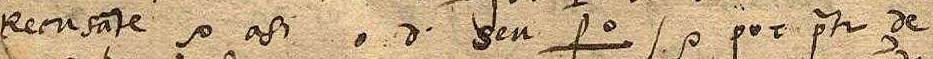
Recusāte e asi o d. seu fo / e por p̄te de
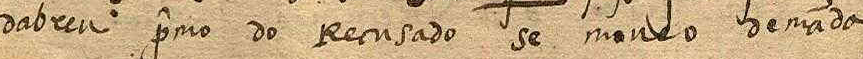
dabreu p̄mo do Recusado se moueo demāda
